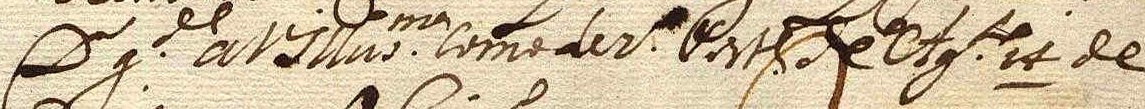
Ds g.de a VSIllus.ma como dez.o este de Ag.to 14 de
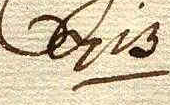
17i3
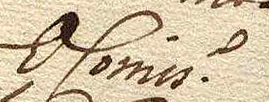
O Comis.o
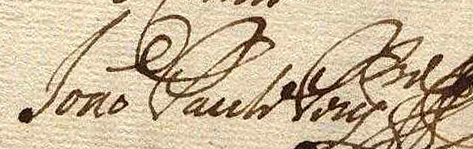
Ioaõ Paulo Prq.ne
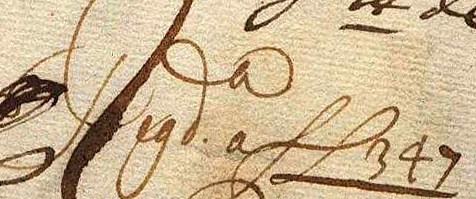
Reg. a fl 347
